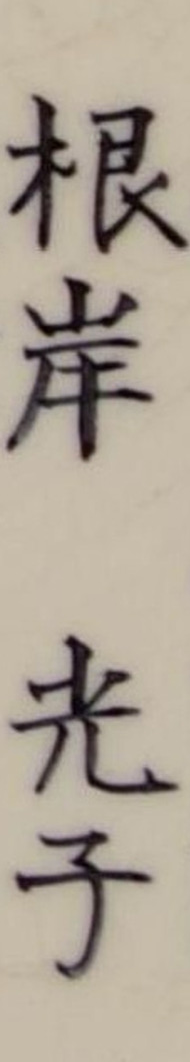根岸光子
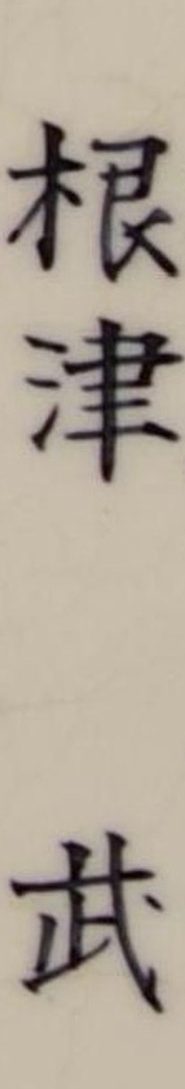根津武
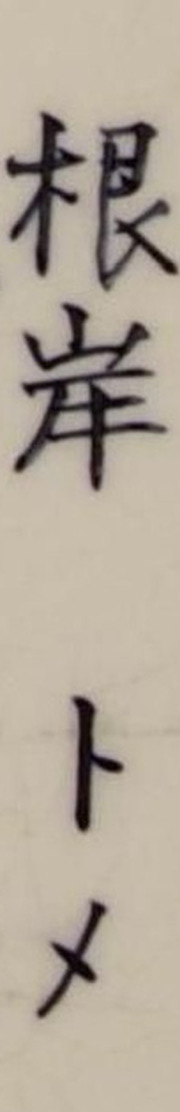根岸トメ
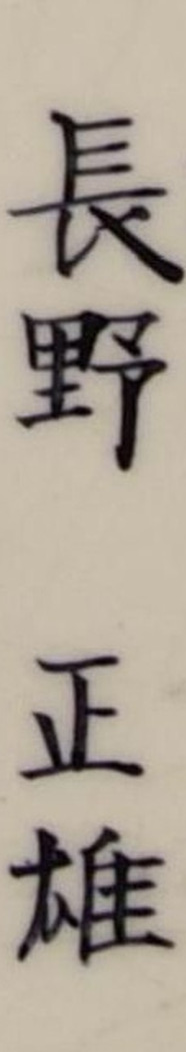長野正雄
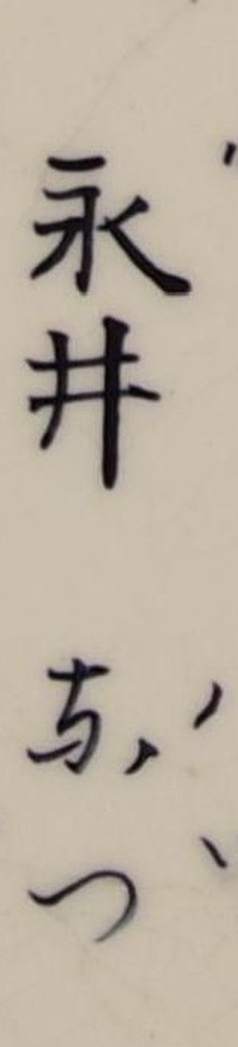永井なつ
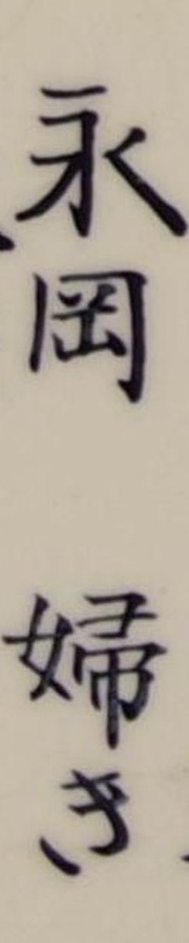永岡ふき
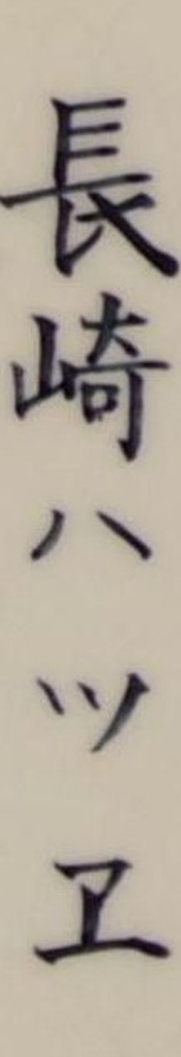長崎ハツエ
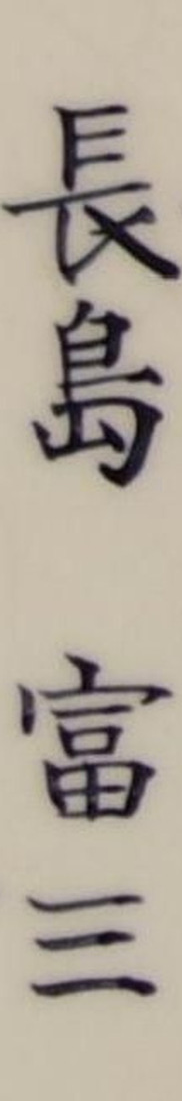長島富三
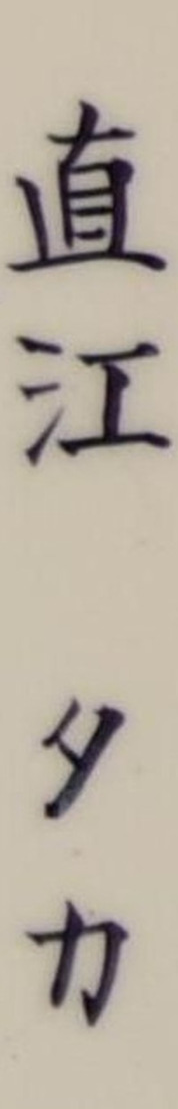直江タカ
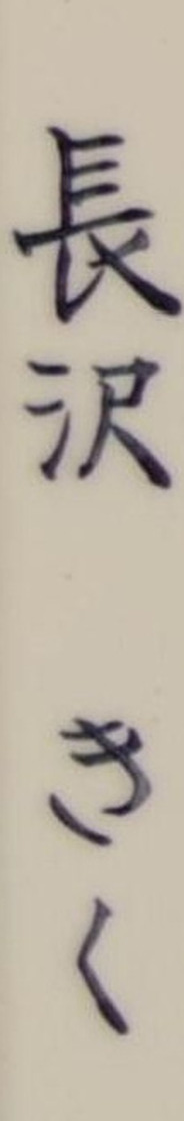長沢きく

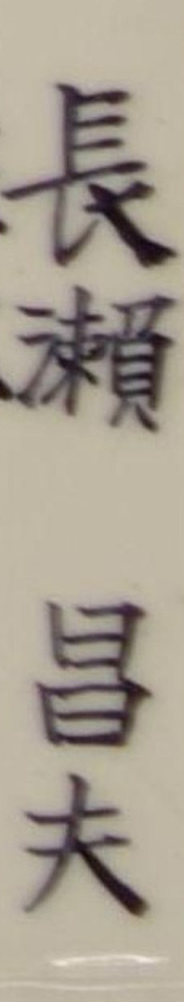長瀬昌夫
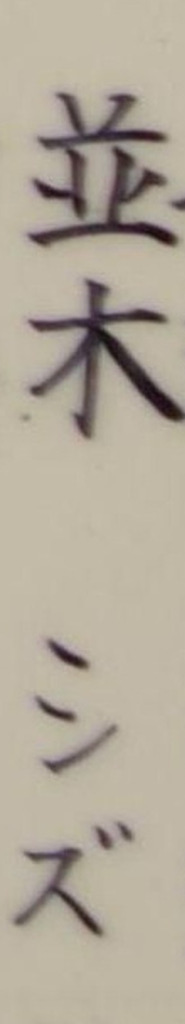並木シズ
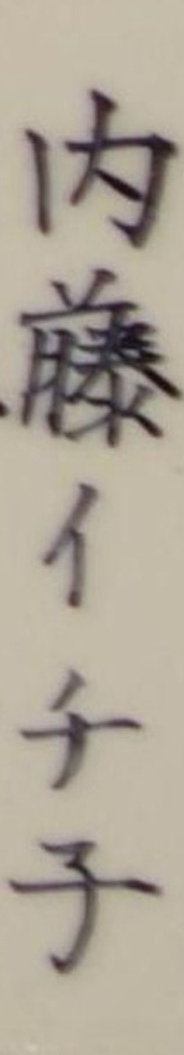内藤イチ子
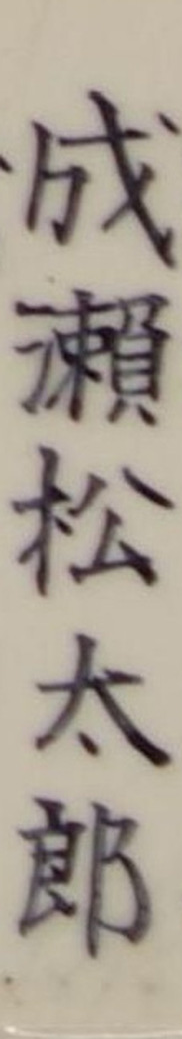成瀬松太郎
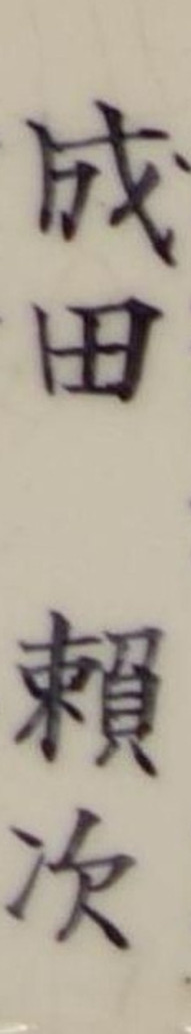成田頼次
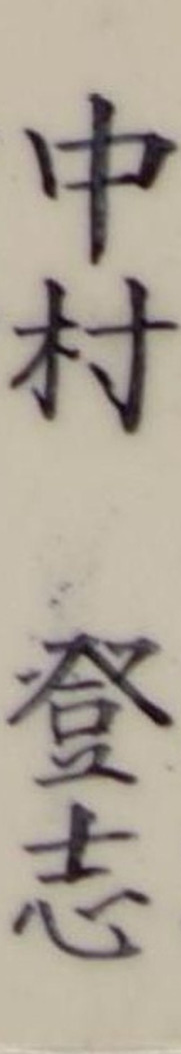中村登志
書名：E~L
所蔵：高野山金剛峯寺
